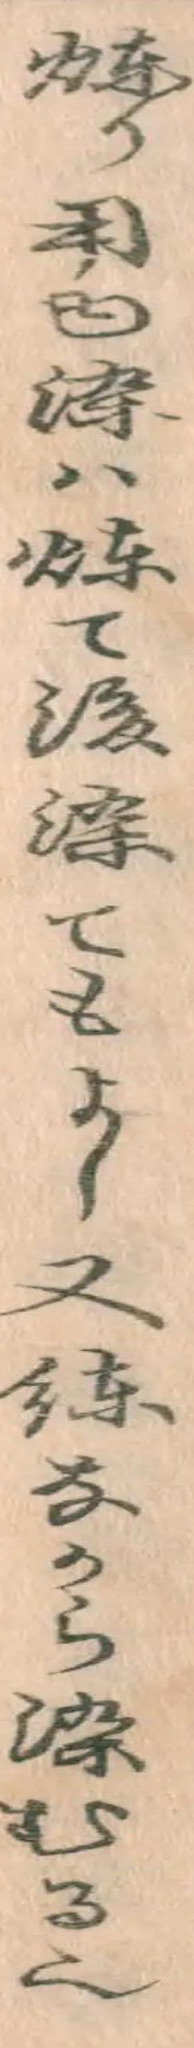煉り用ゆ染は煉て後染てもよし又煉なから染むる也
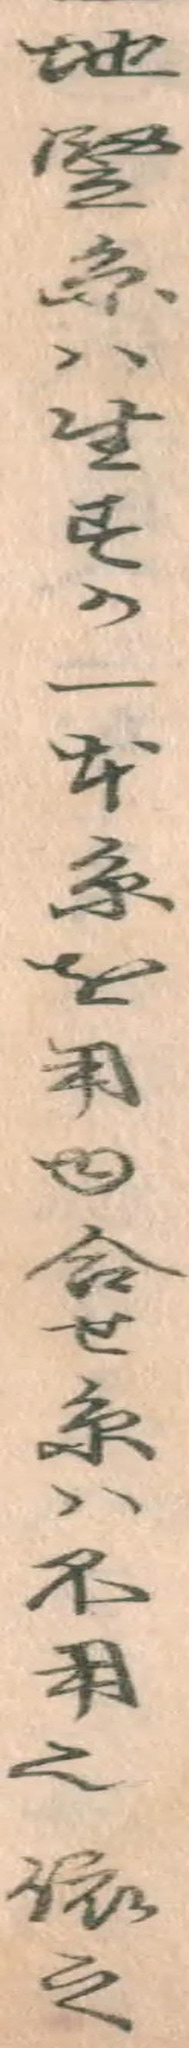一地竪糸は生すか一本糸を用ゆ合せ糸は不用也依之
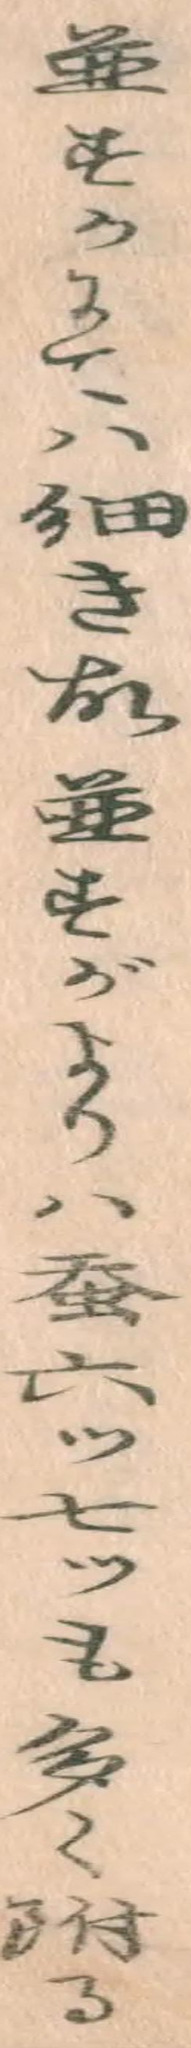並すかにては細き故並すがよりは蚕六ッ七ッも多く附る
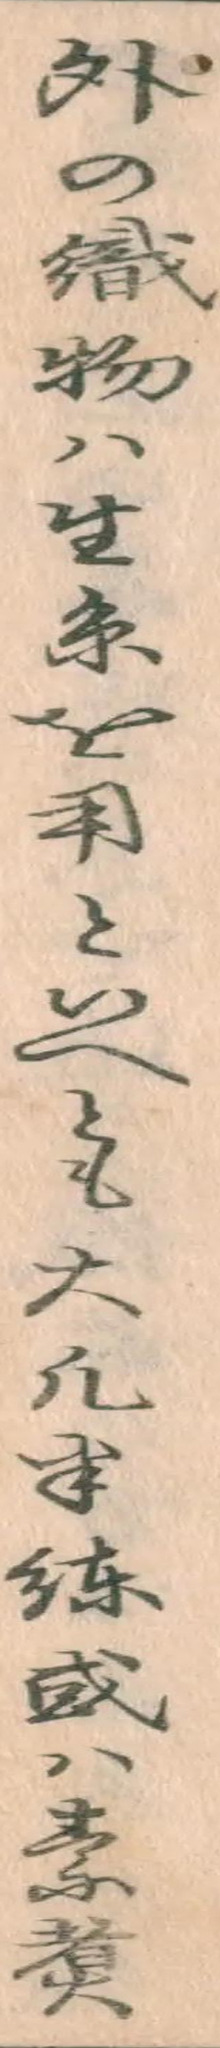外の織物は生糸を用といへとも大凡半煉或は素煮
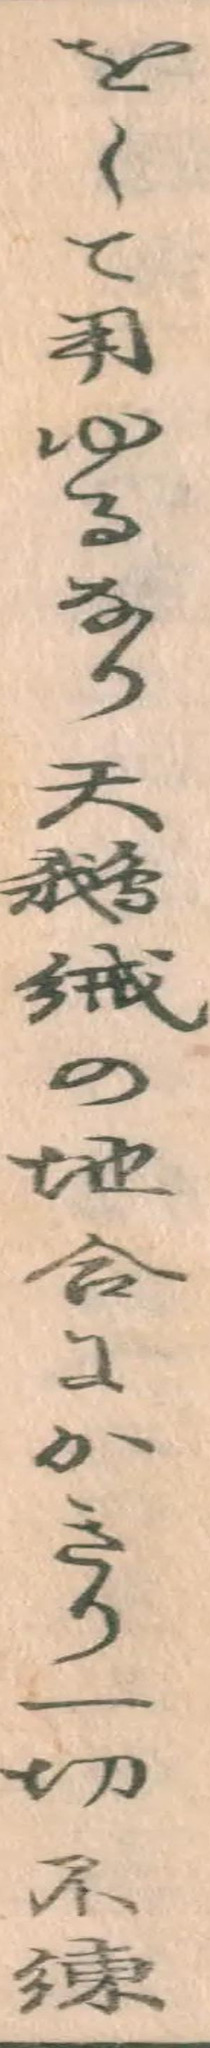をして用ゆるなり天鵝絨の地合にかきり一切不練
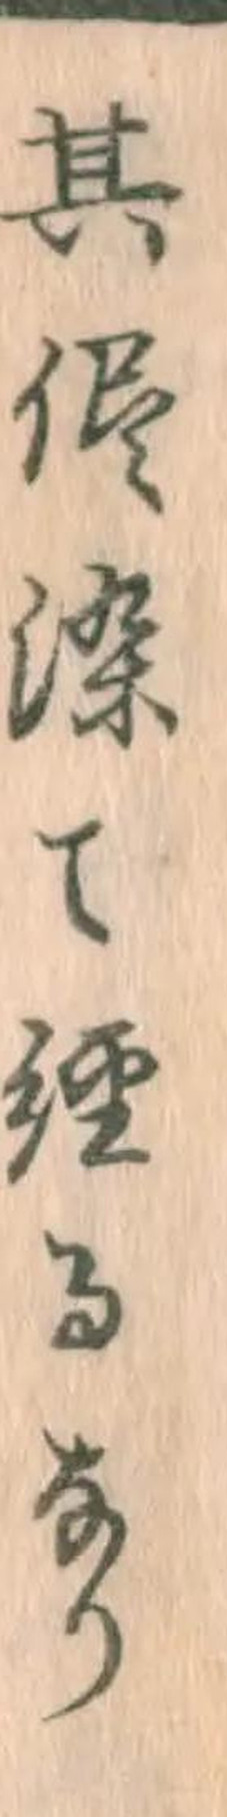其侭染て経るなり
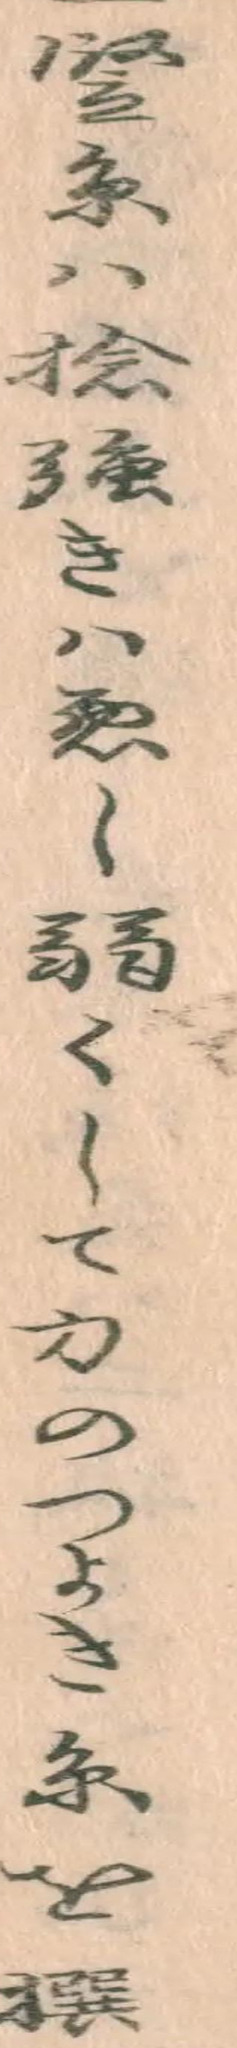一竪糸は捻強きは悪し弱くして力のつよき糸を撰
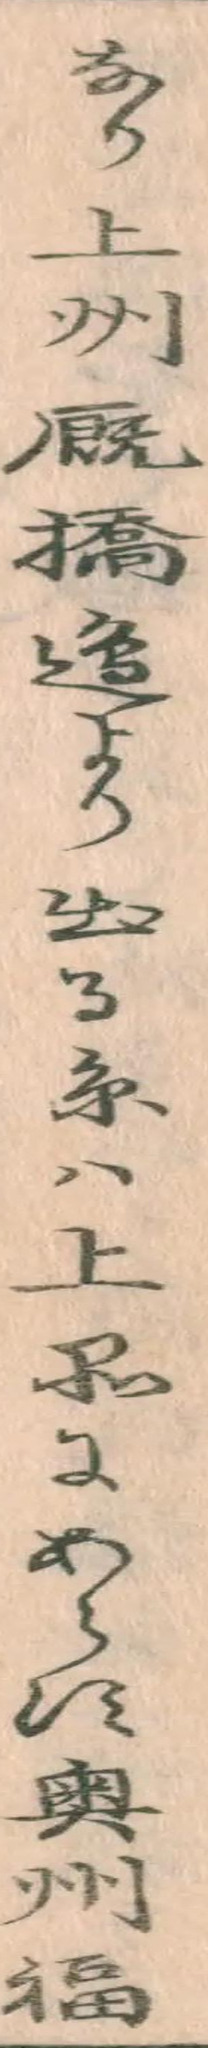なり上州厩橋辺より出る糸は上品にあらす奥州福
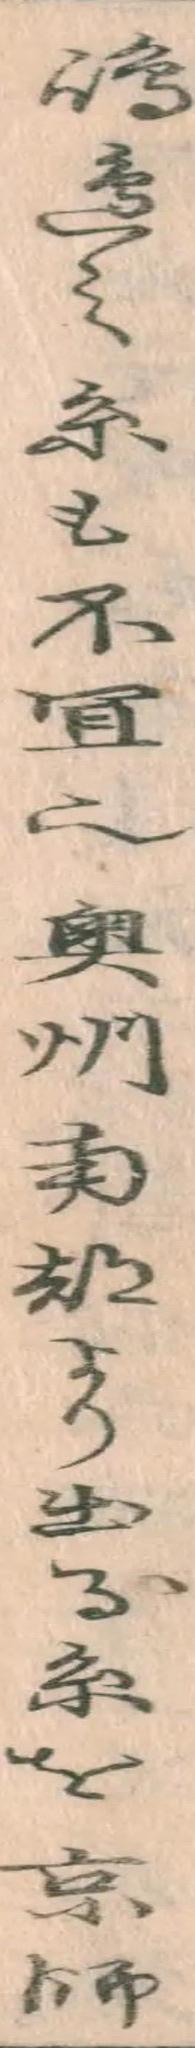島辺之糸も不宜也奥州南都より出る糸を京師
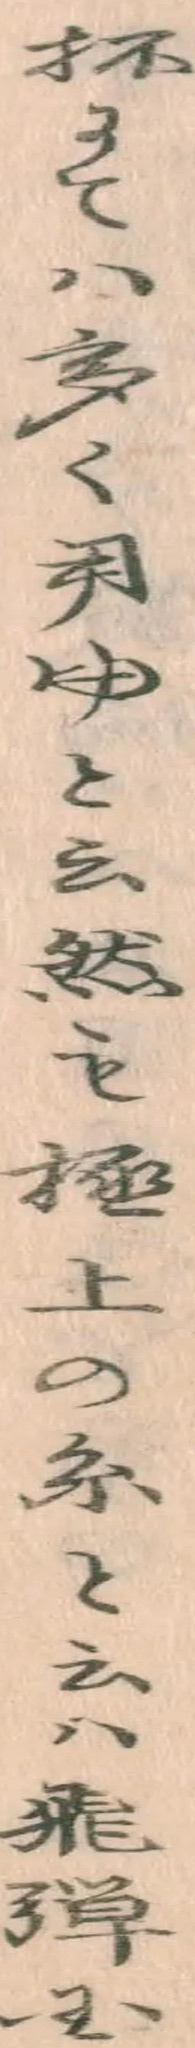抔にては多く用ゆと云然も極上の糸と云は飛弾国
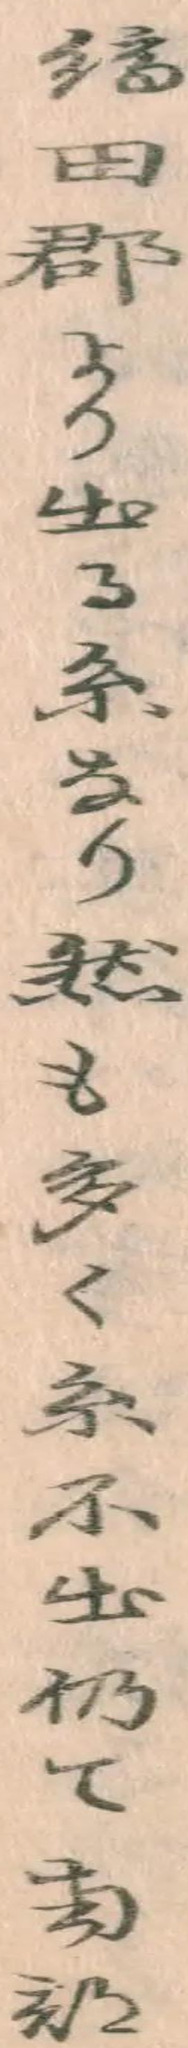縞田郡より出る糸なり然も多く糸不出仍て南部
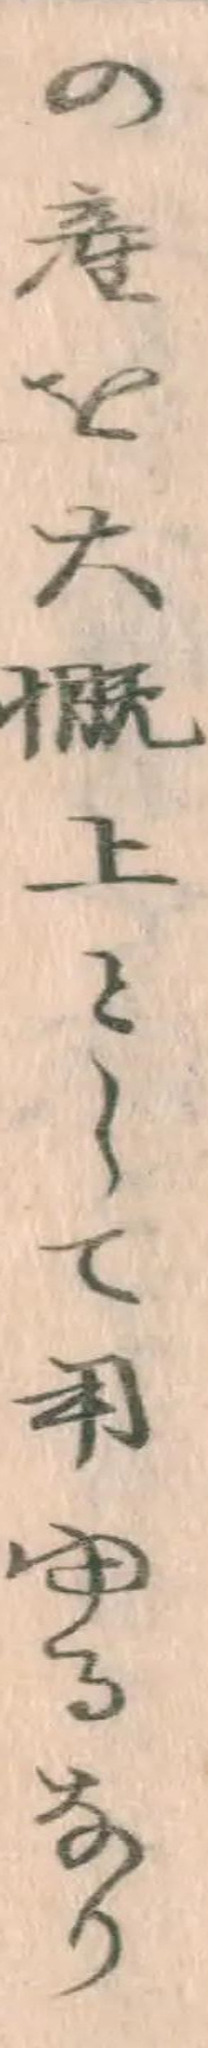の産を大慨上として用ゆるなり
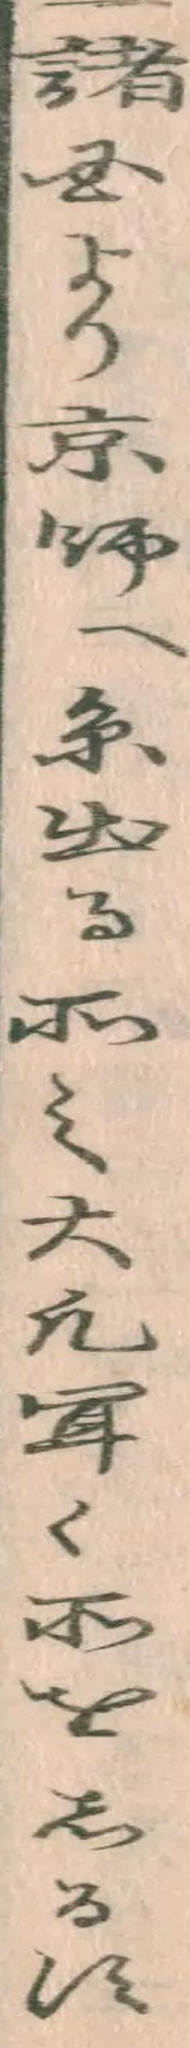一諸国より京師へ糸出る所之大凡聞く所をしるす
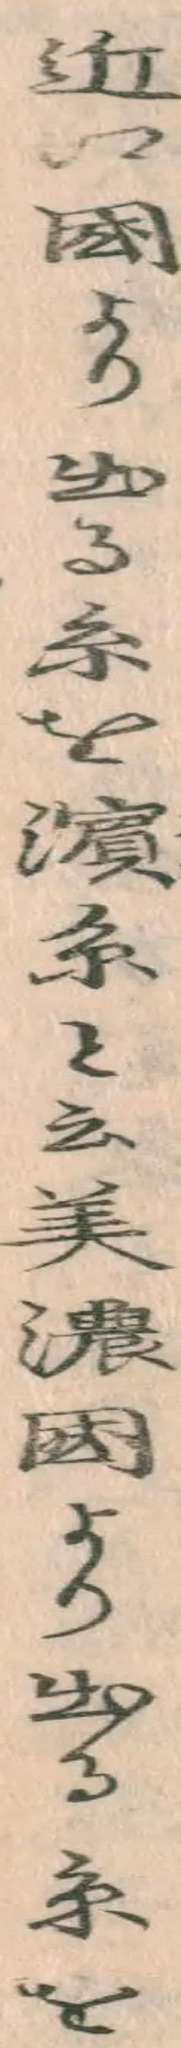近江国より出る糸を浜糸と云美濃国より出る糸を
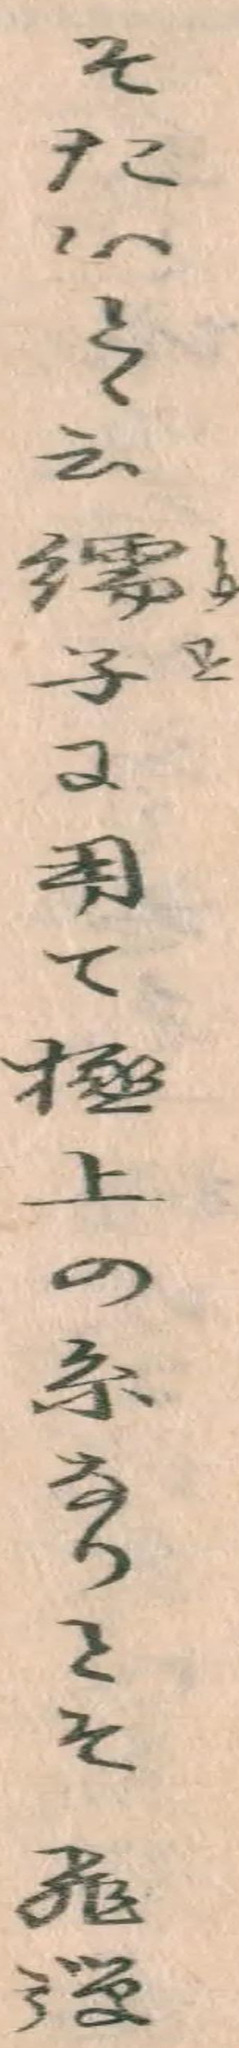そたいとゝ云繻子に用て極上の糸なりとそ飛弾
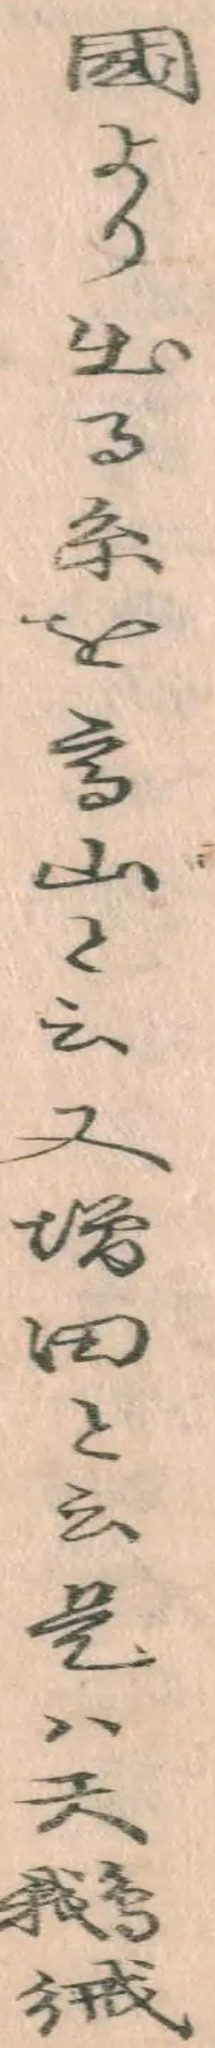国より出る糸を高山と云又増田と云是は天鵝絨
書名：機織彙編 5巻. [2]
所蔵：国立国会図書館 National Diet Library, JAPAN
